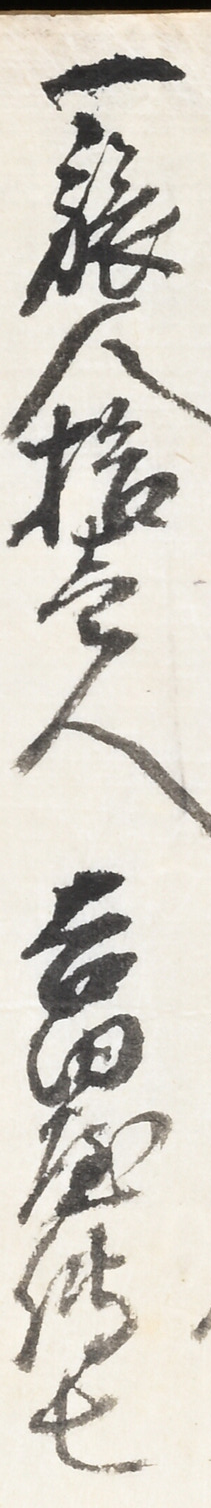一旅人拾壱人吉田屋伝七
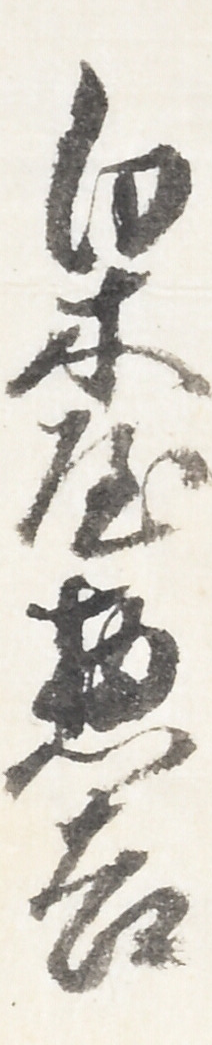白木屋惣吉
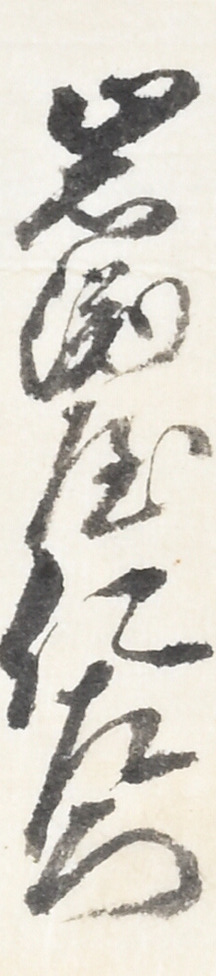岩渕屋仁左衛門
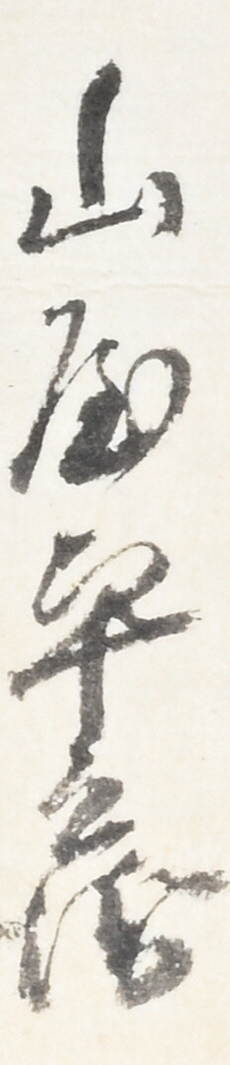山屋平兵衛
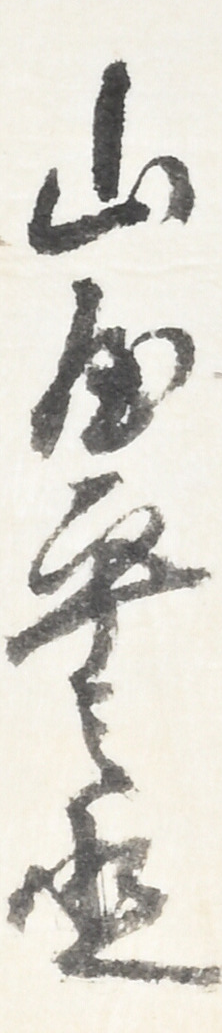山屋平之丞
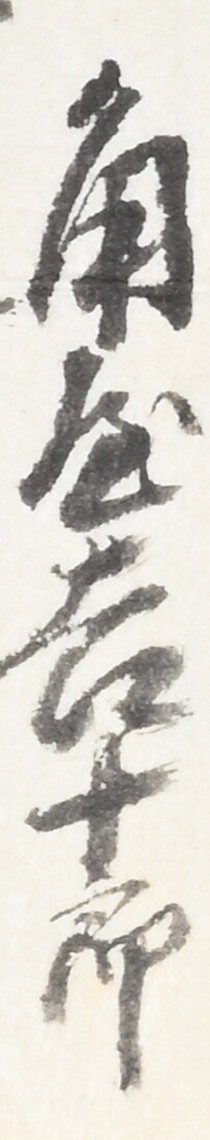角屋吉十郎
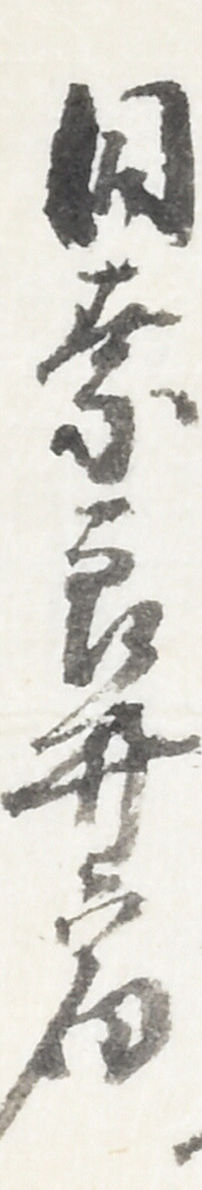同奈良井宿
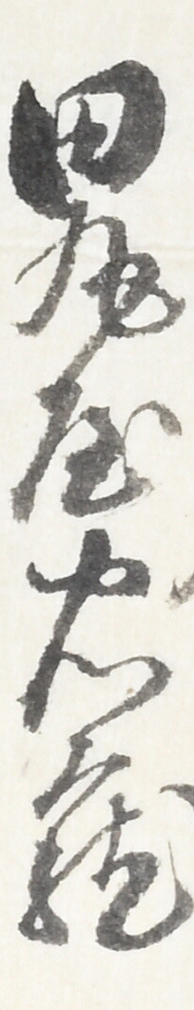田丸屋忠蔵
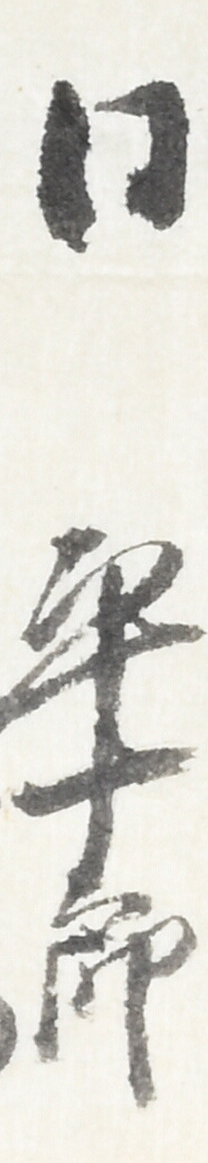同平十郎
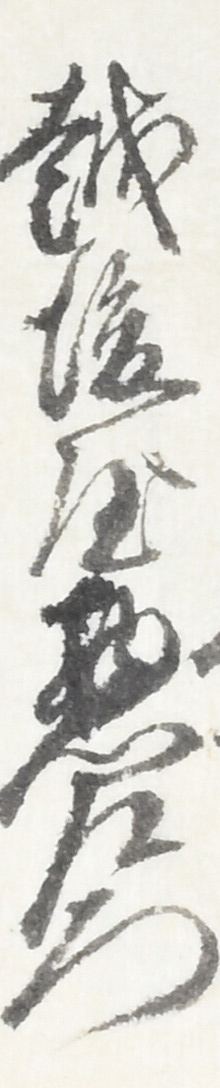越後屋惣左衛門
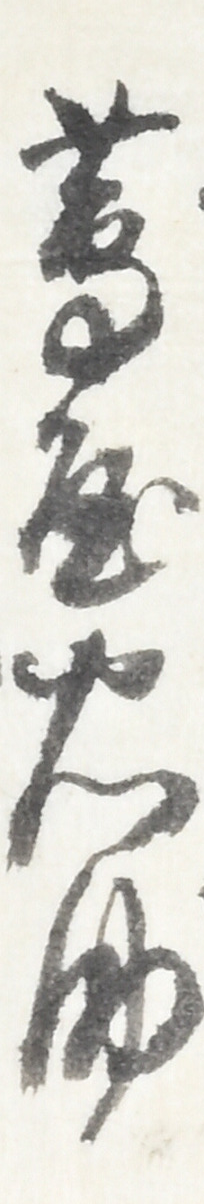蔦屋忠助
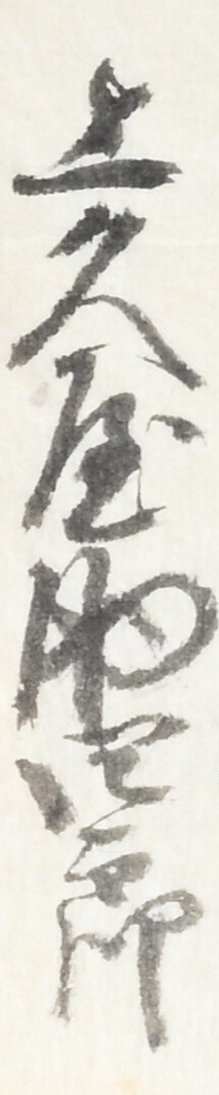上久屋助四郎

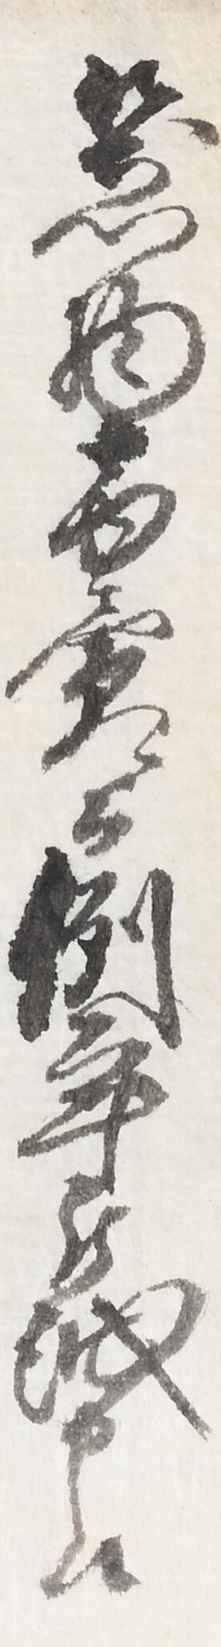器物商売ニ而例年罷越申候
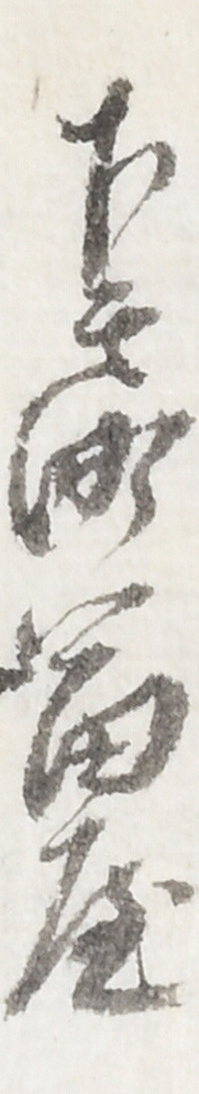下モ町冨屋
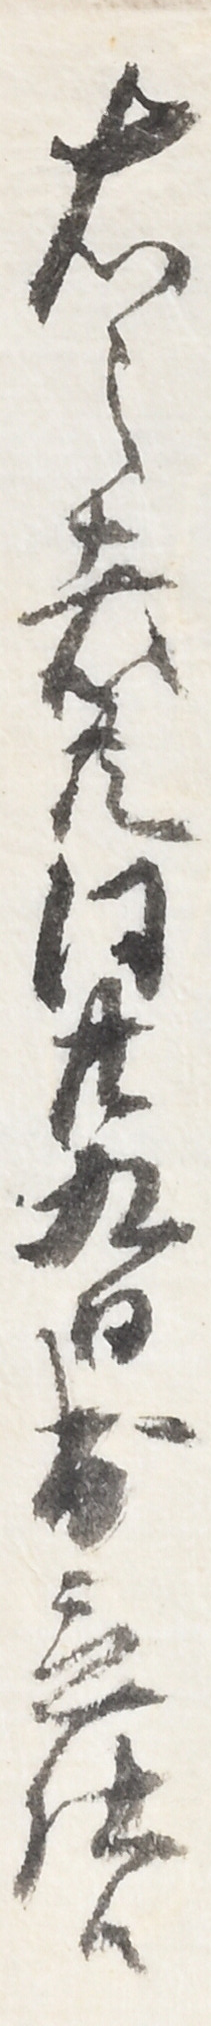右之者共同廿九日出立仕候
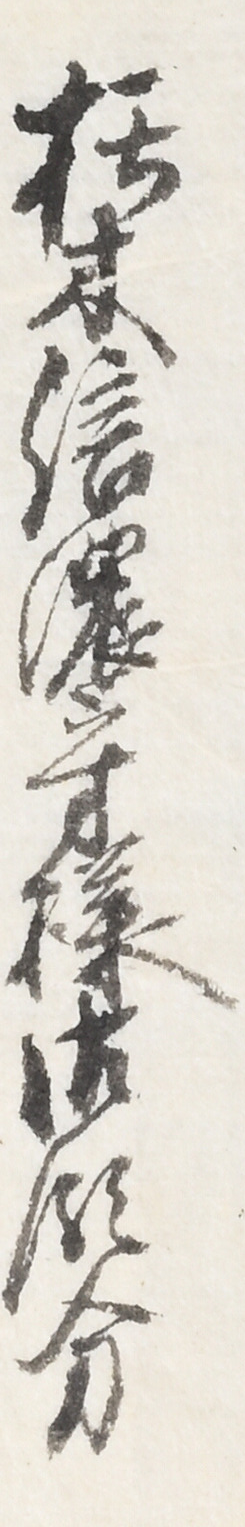朽木信濃守様御領分
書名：旅人泊控帳
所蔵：伊那市立高遠町図書館・合同会社AMANE
